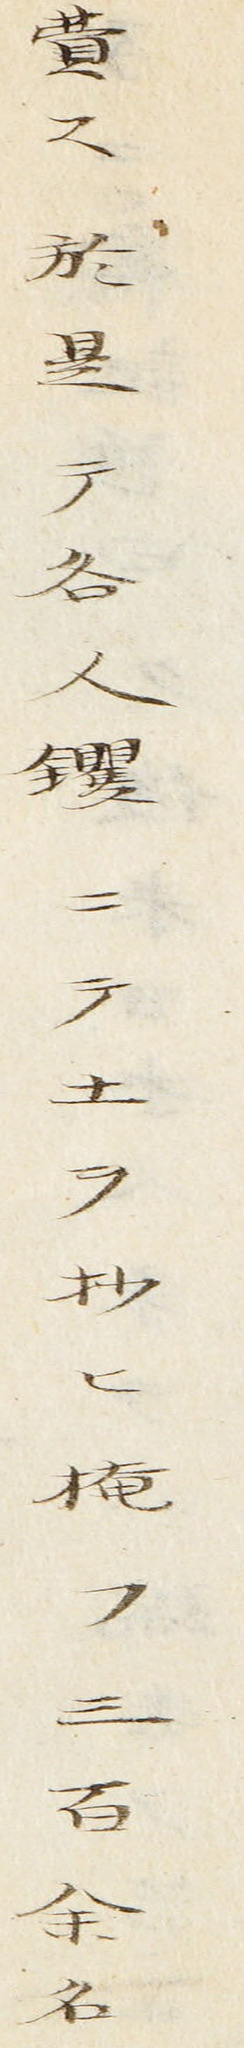費ス於是テ各人钁ニテ土ヲ抄ヒ掩フ三百余名
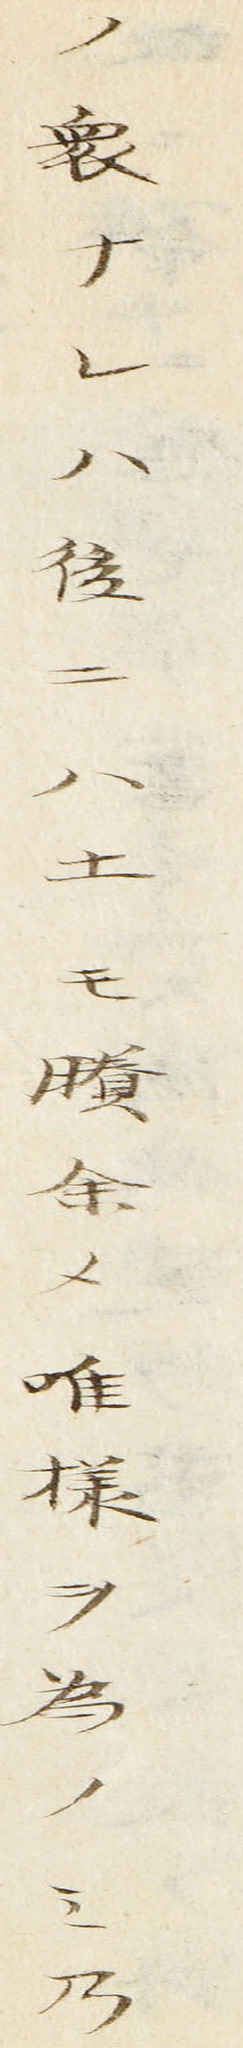ノ衆ナレハ後ニハ土モ賸余シテ唯様ヲ為ノミ乃
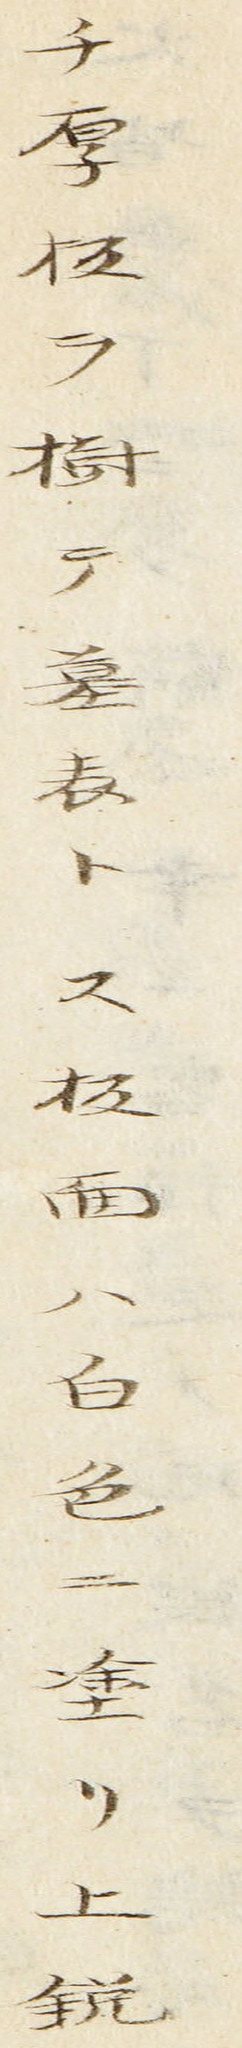チ厚板ヲ樹テ墓表トス板面ハ白色ニ塗リ上鋭
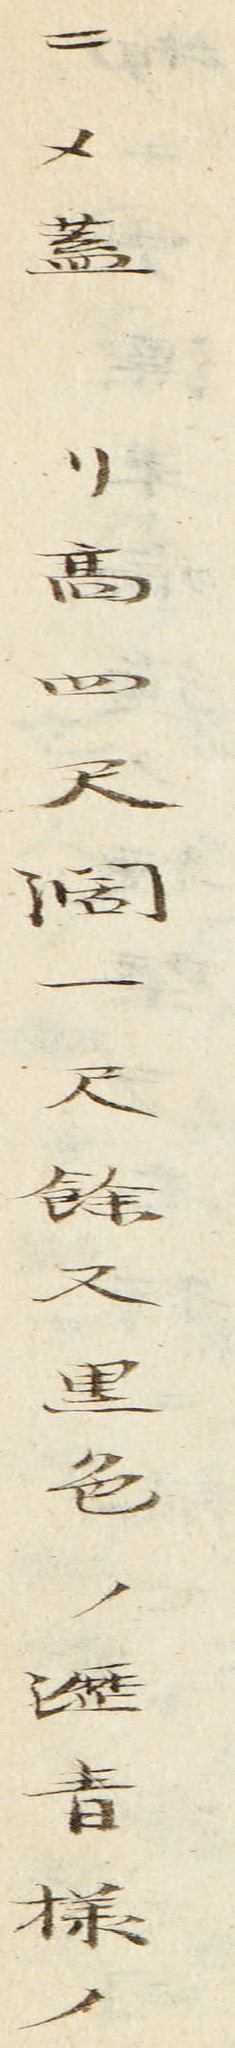ニシテ蓋リ高四尺濶一尺余又黒色ノ瀝青様ノ

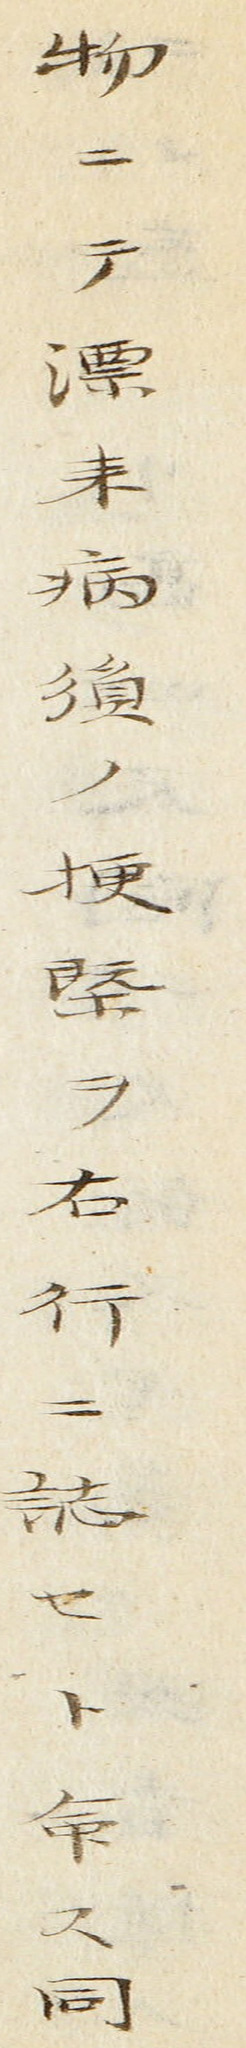物ニテ漂来病ノ梗槩ヲ右行ニ誌セト命ス同
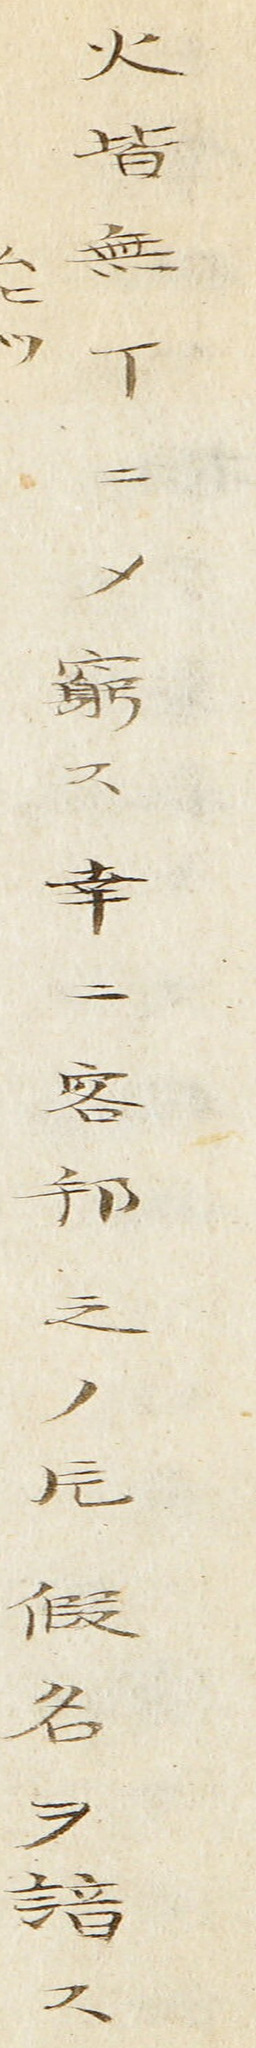火皆無丁ニシテ窮ス幸ニ客邦之ノ片仮名ヲ諳ス
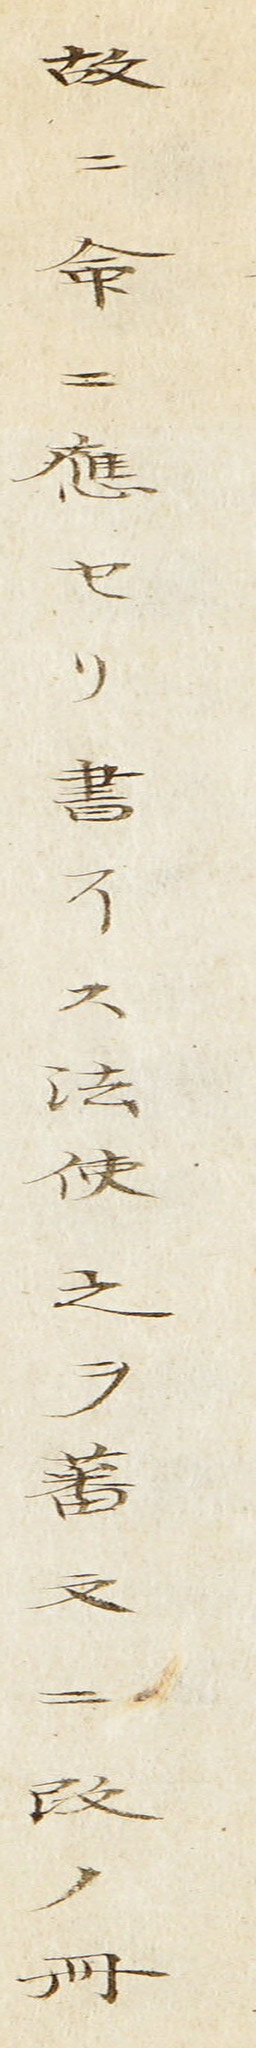故ニ命ニ応セリ書了ス法使之ヲ蕃文ニ改ノ冊
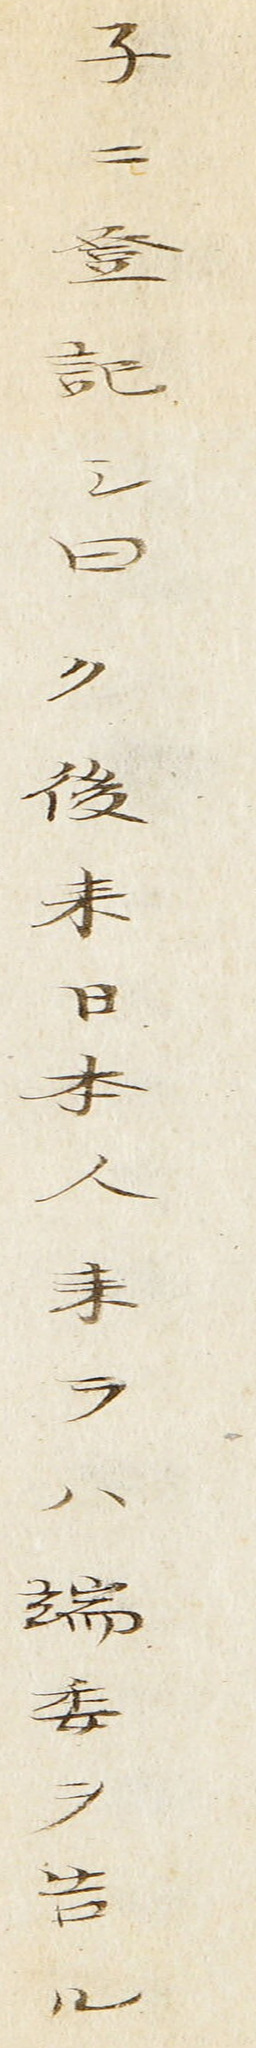子ニ登記シ曰ク後来日本人来ラハ端委ヲ告ル
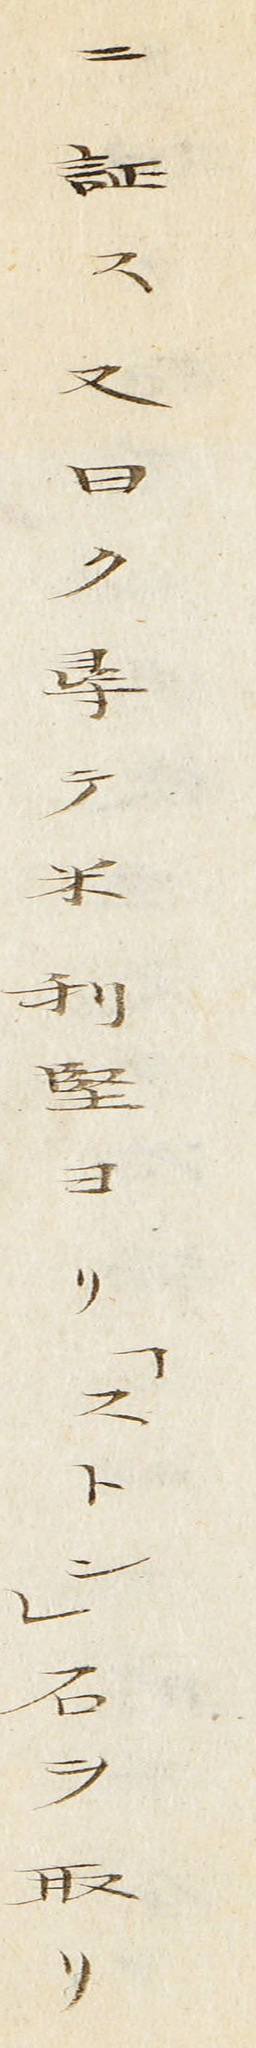ニ証ス又曰ク尋テ米利堅ヨリ「ストン」石ヲ取リ
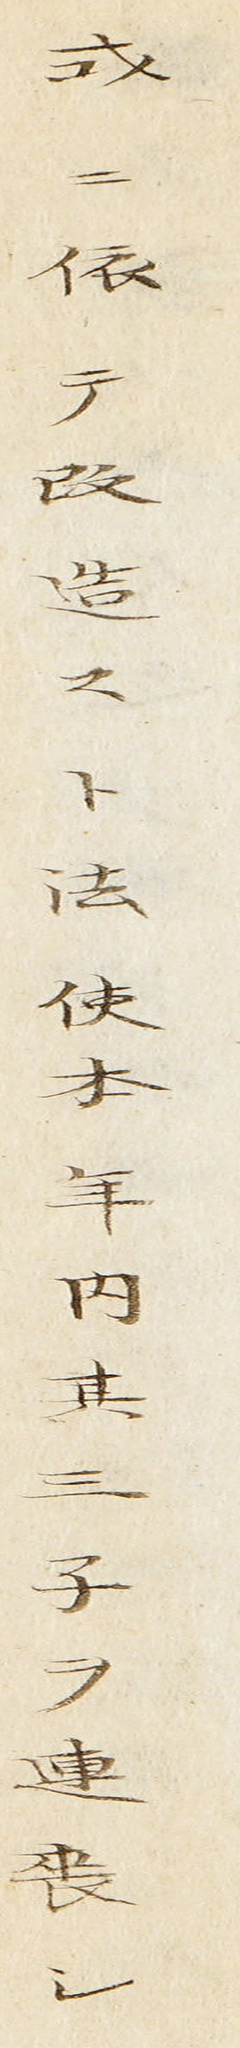ニ依テ改造スト法使本年内其三子ヲ連䘮シ
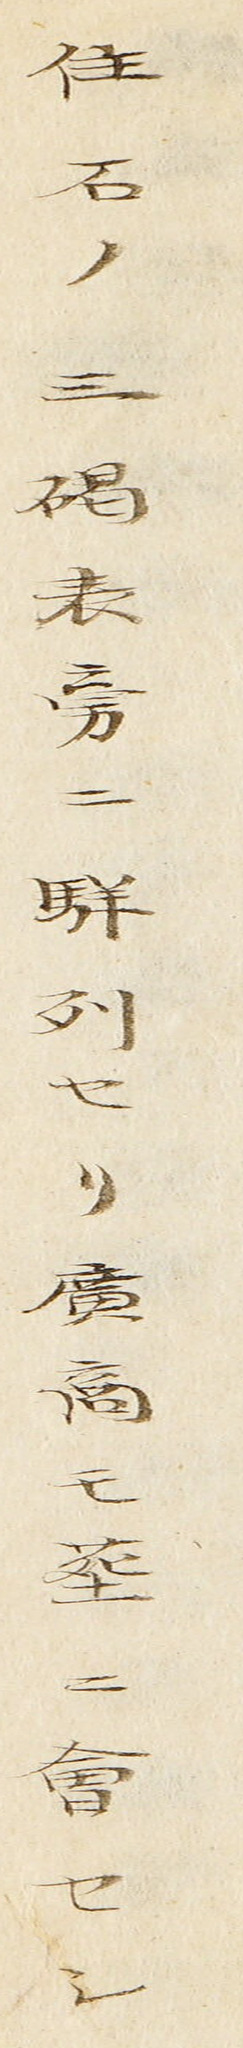佳石ノ三碣表旁ニ列セリ広商モ塟ニ会セシ
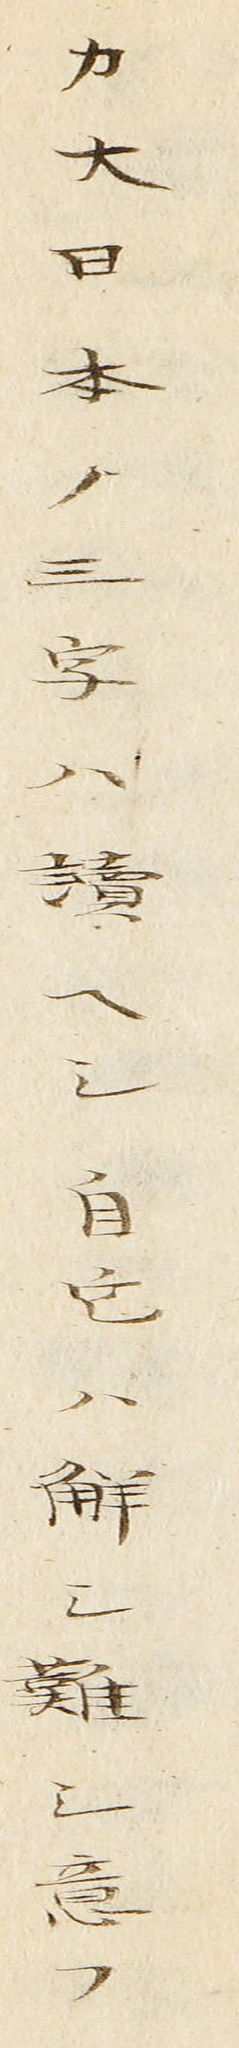カ大日本ノ三字ハ読ヘシ自宅ハ觧シ難シ意フ
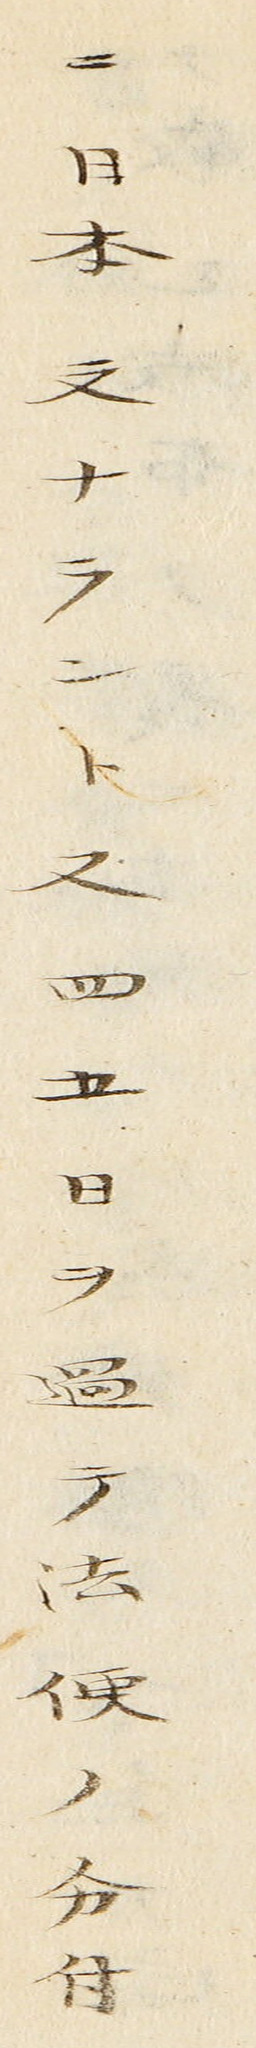ニ日本文ナラント又四五日ヲ過テ法便ノ分付
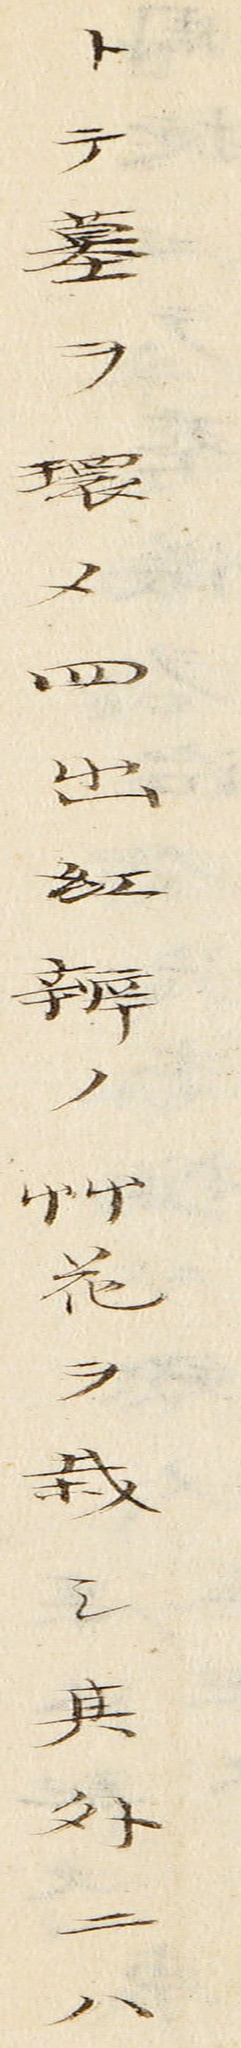トテ墓ヲ環シテ四出紅弁ノ艸花ヲ栽シ其外ニハ
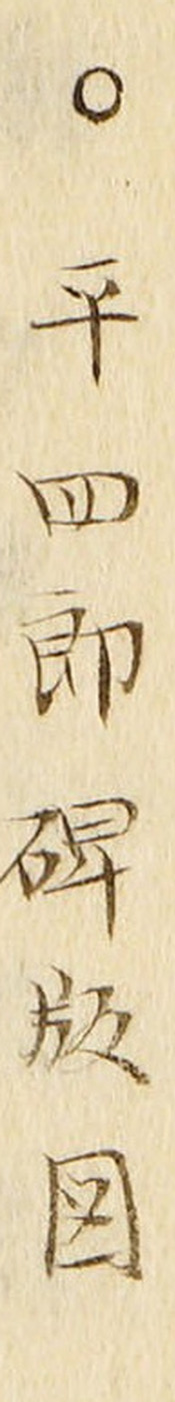◦平四郎碑版図
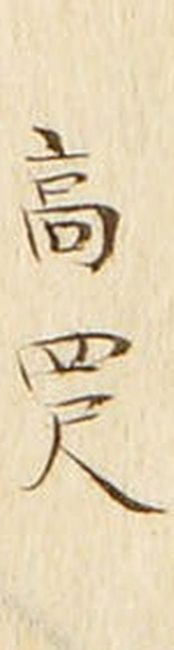高四尺
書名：流蕃通書
